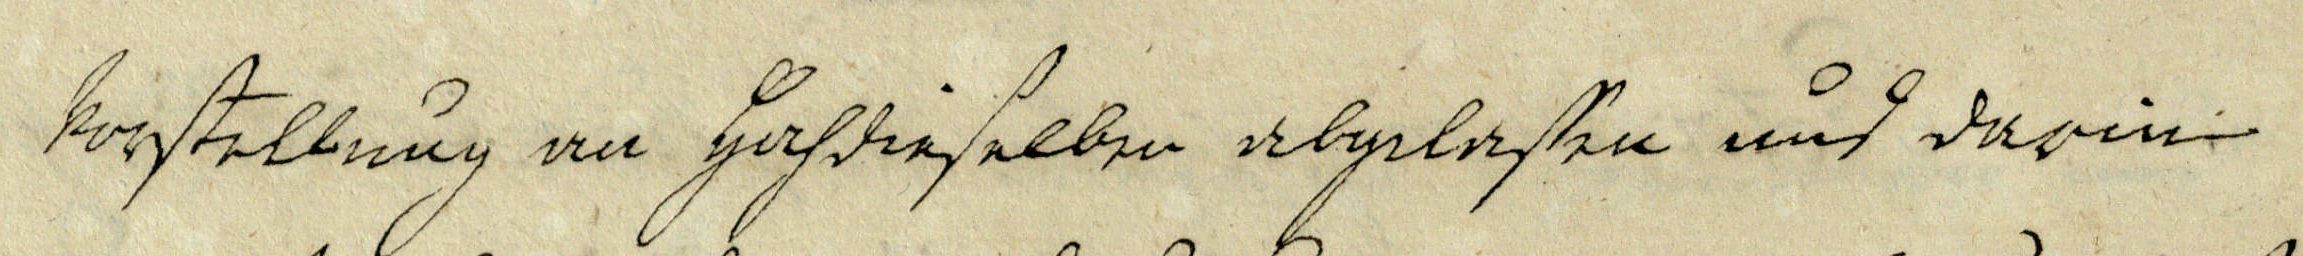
Vorstellung an Hochdieselben abgelassen und darin
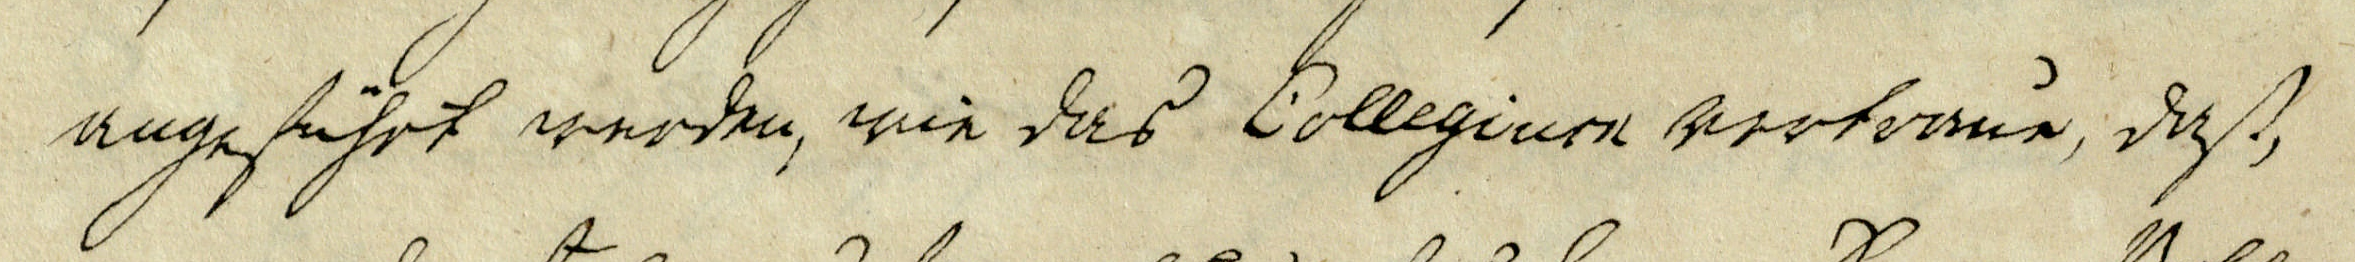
angeführt werden, wie das Collegium vertraue, daß,
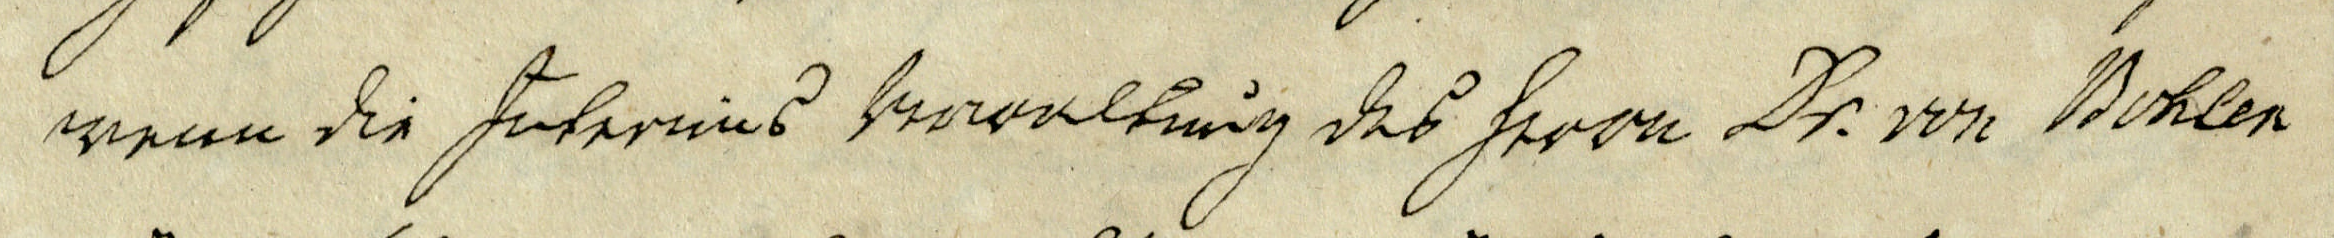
wenn die Interims Verwaltung des Herrn Dr. von Bohlen
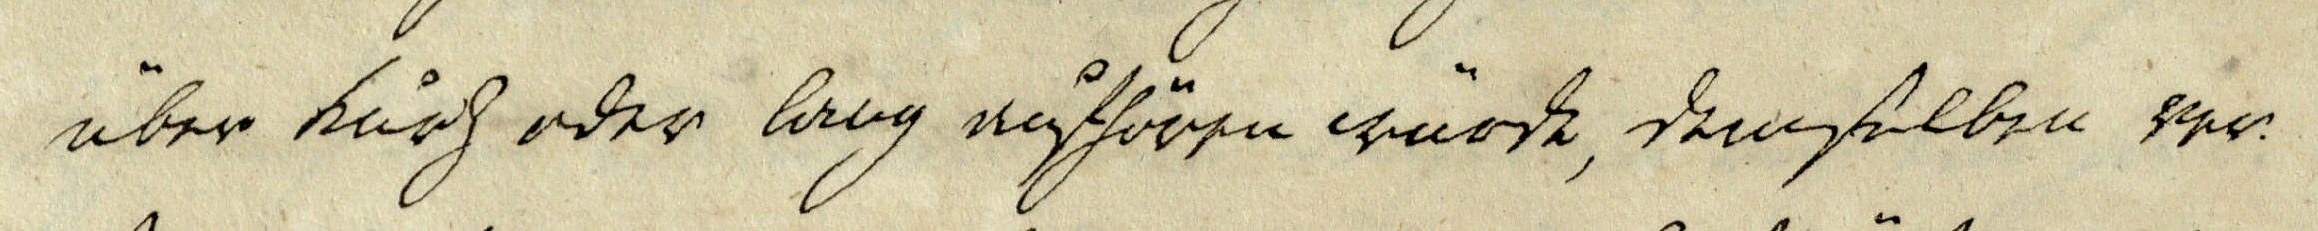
über kurz oder lang aufhören würde, demselben ver¬
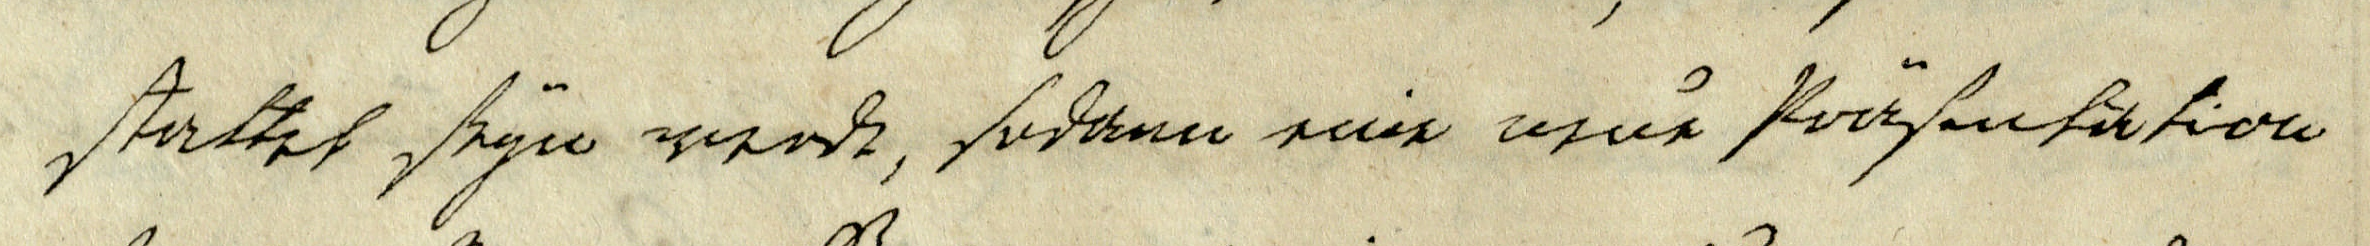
stattet seÿn werde, sodann eine neue Präsentation
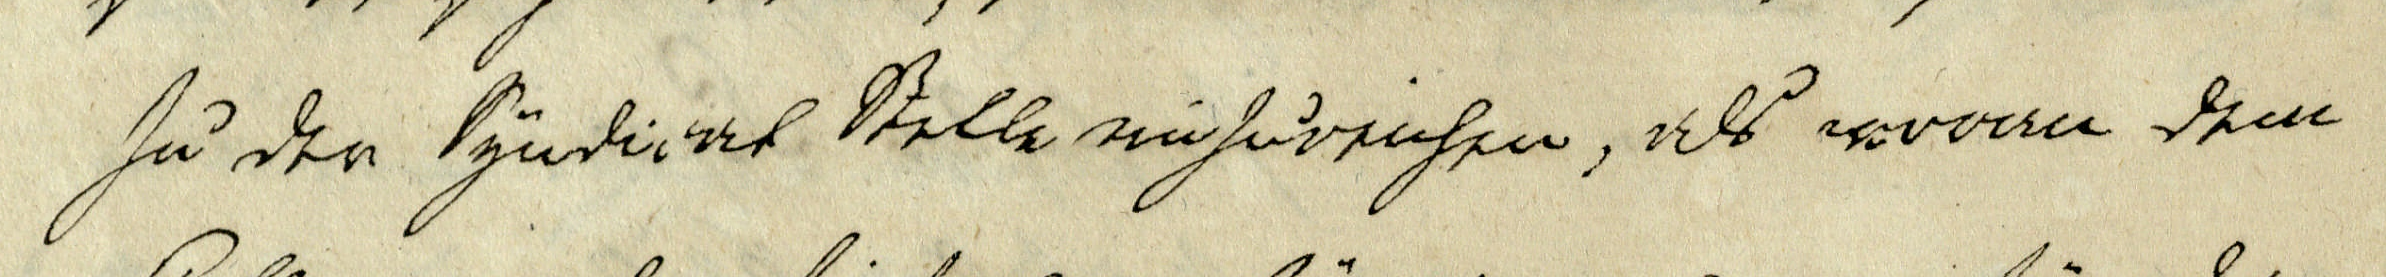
zu der Sÿndicat Stelle einzureichen, als woran dem
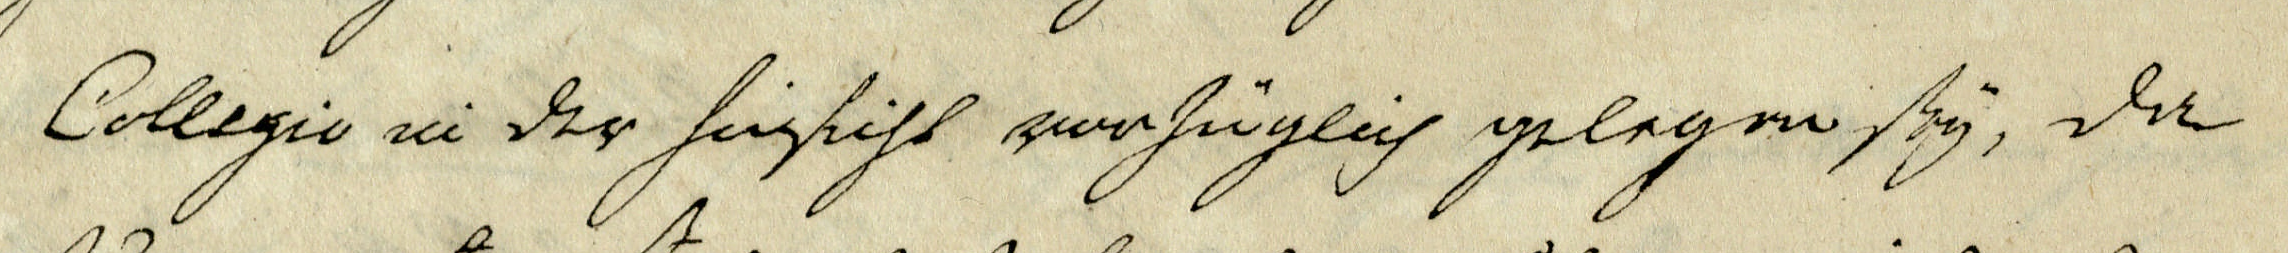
Collegio in der Hinsicht vorzüglich gelegen seÿ, da
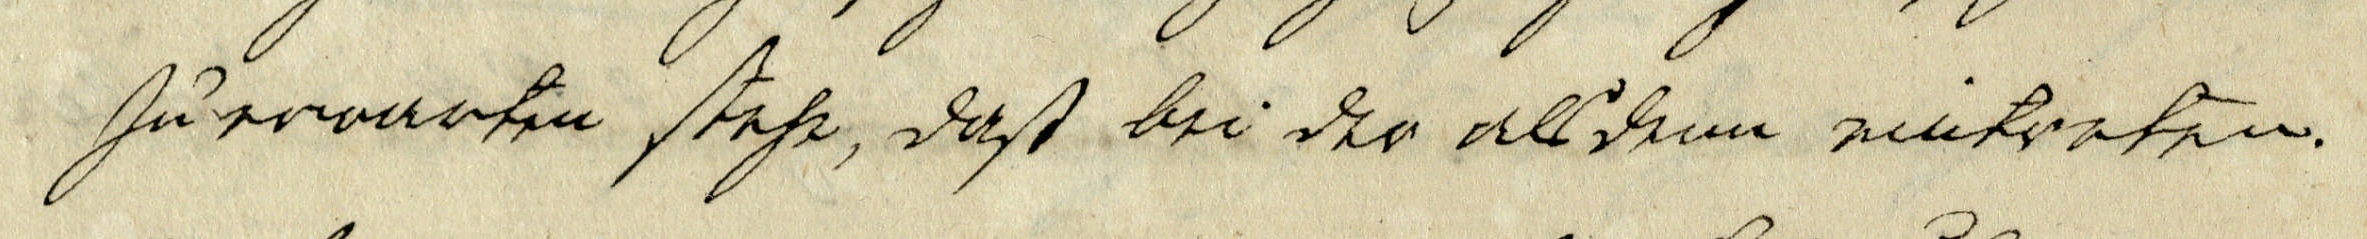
zu erwarten stehe, daß bei der alsdenn eintreten¬
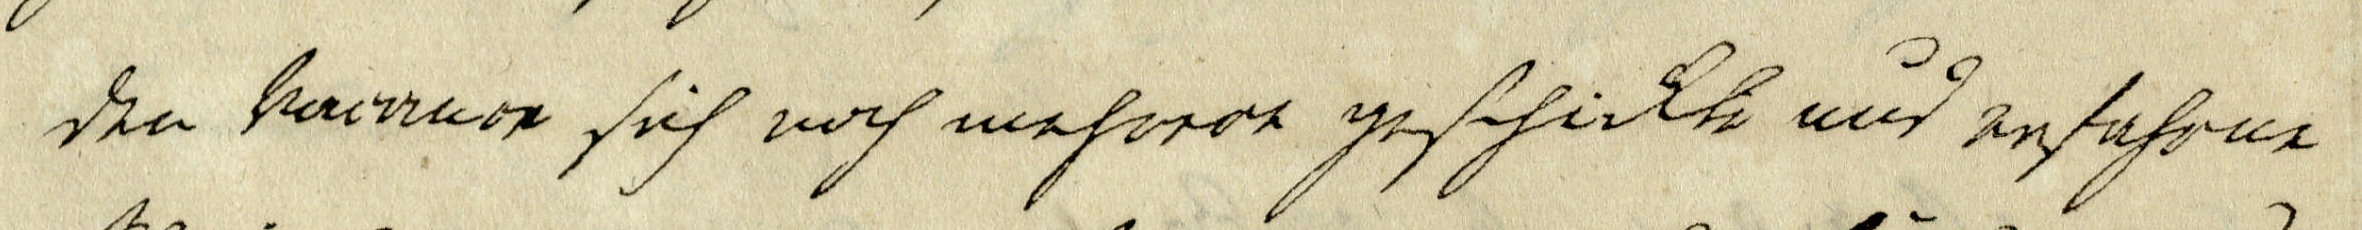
den Vacance sich noch mehrere geschickte und erfahrne
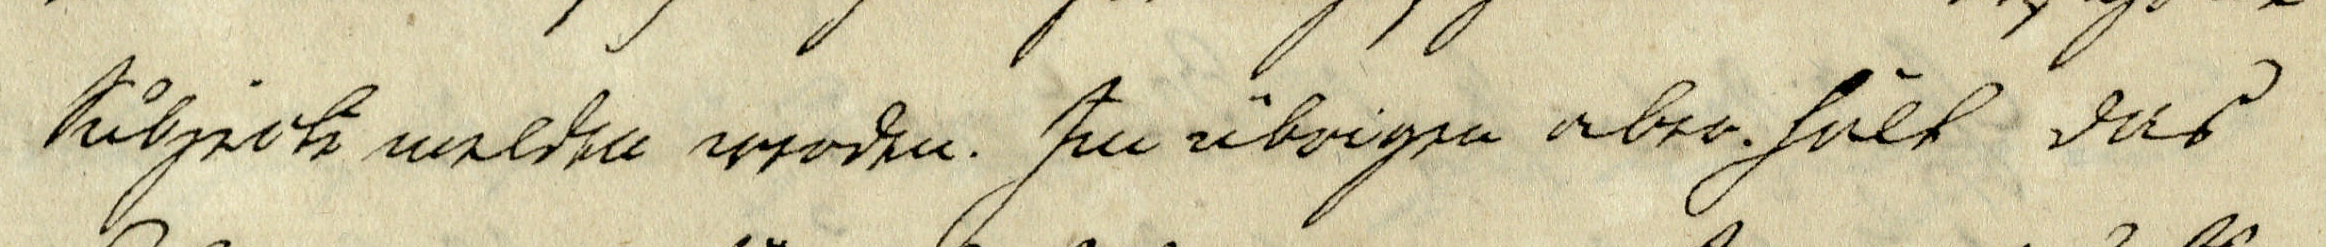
Subjecte melden werden. Im übrigen aber hält das
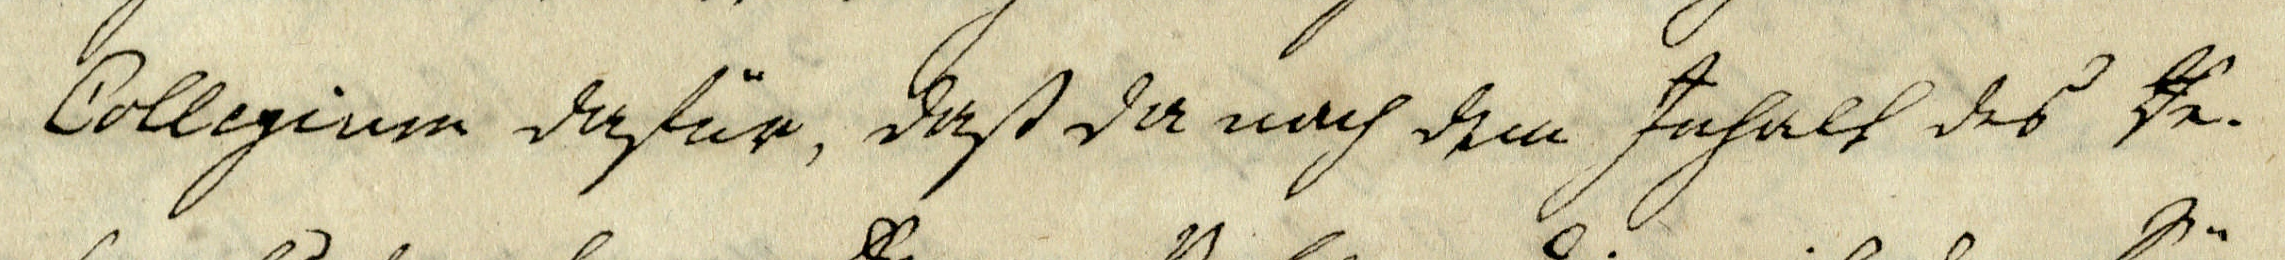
Collegium dafür, daß da nach dem Inhalt des Re¬
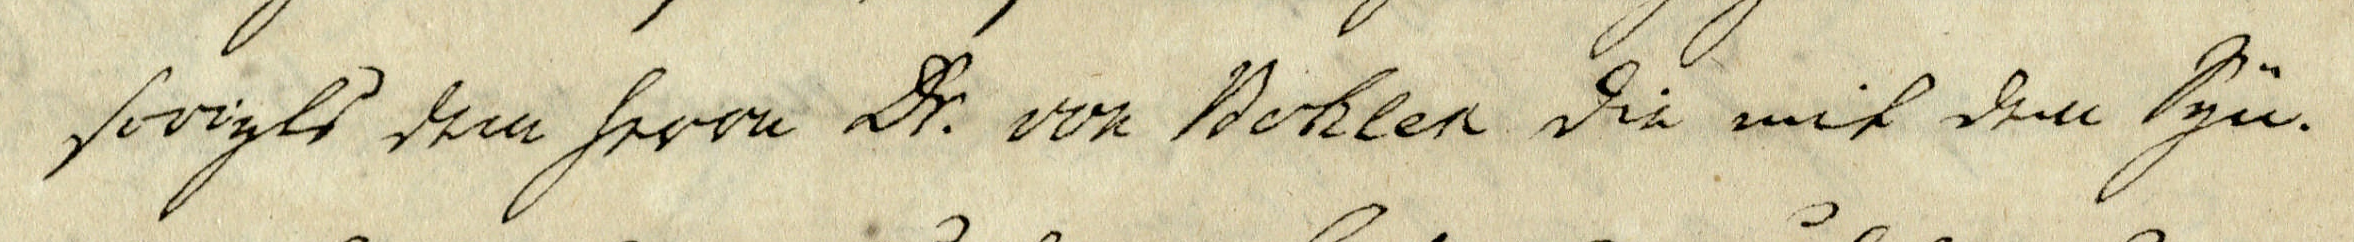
scripts dem Herrn Dr. von Bohlen die mit dem Sÿn¬
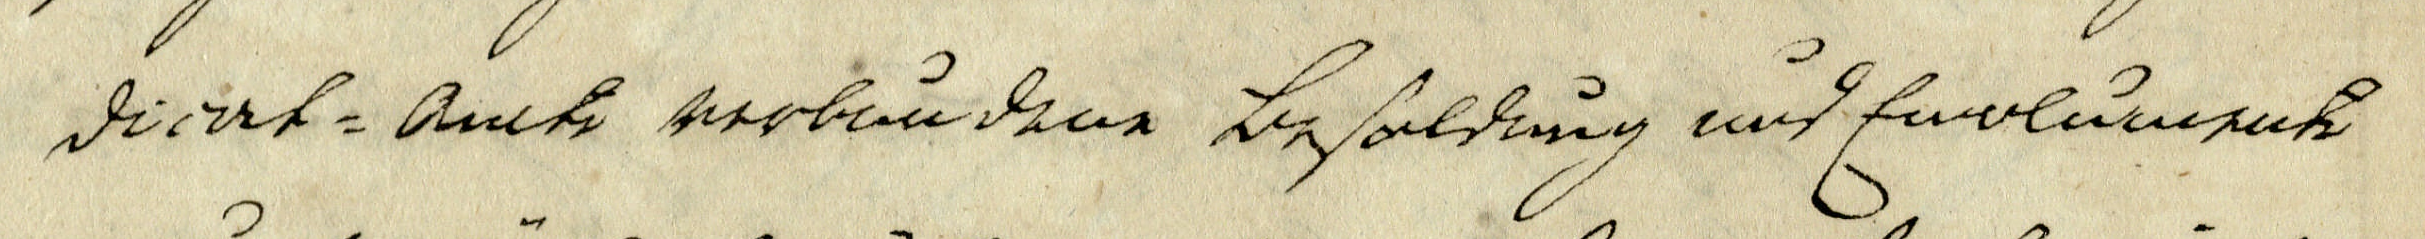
dicat - Amte verbundene Besoldung und Emolumente
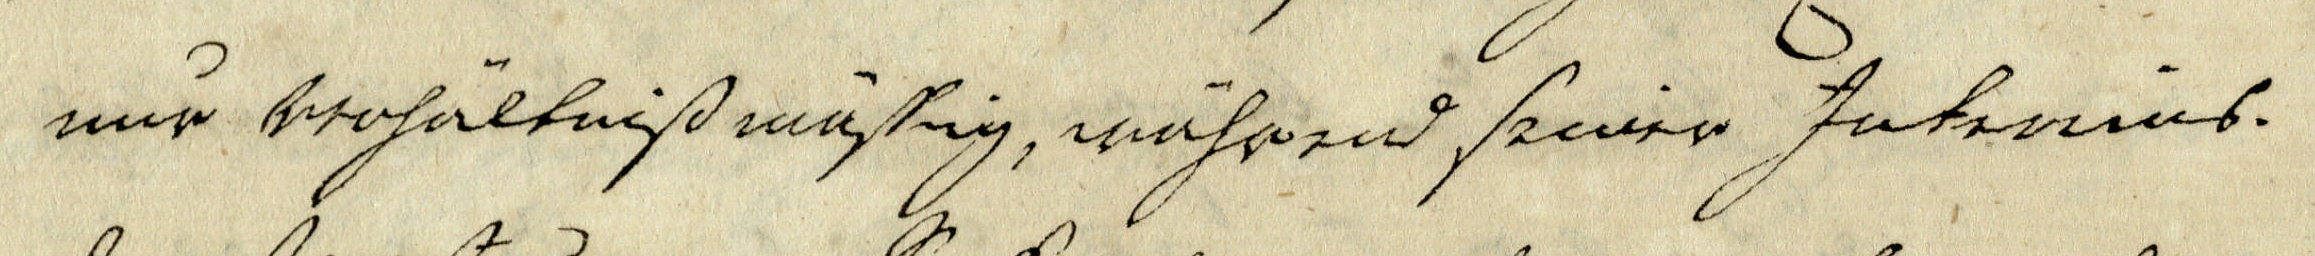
nur Verhältniß mässig, während seiner Interims¬
